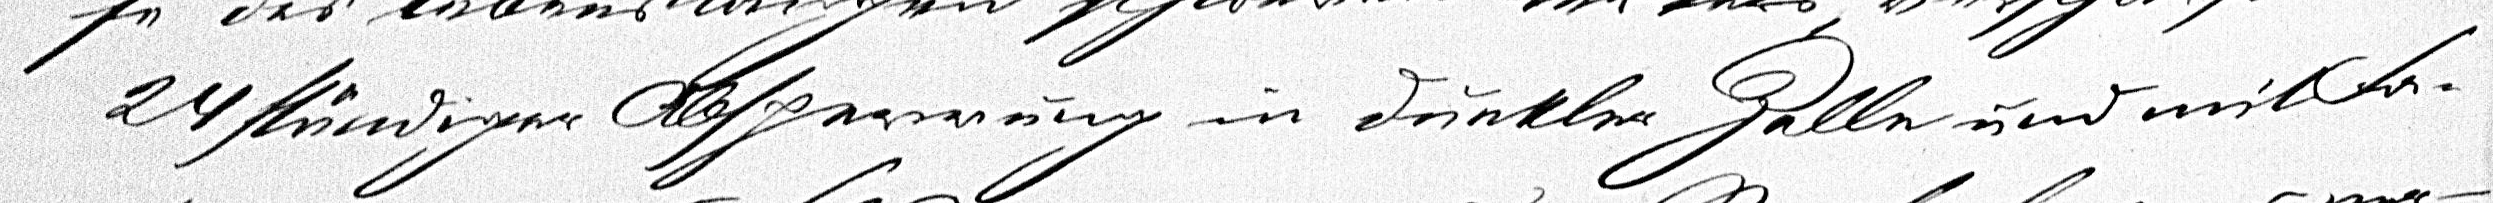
24 stündiger Absperrung in dunkler Zelle und mit Fa¬
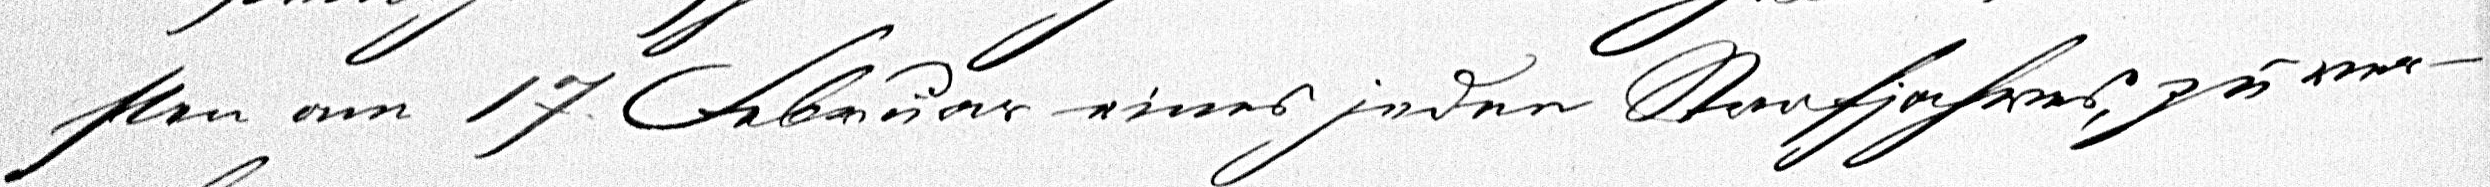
sten am 17. Februar eines jeden Strafjahres, zu ver¬
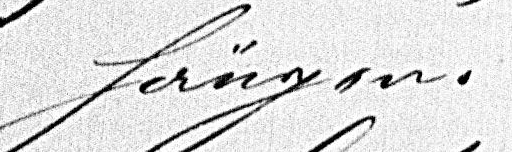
hängen.
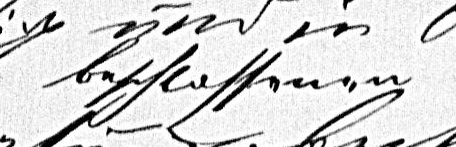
beschlossenen
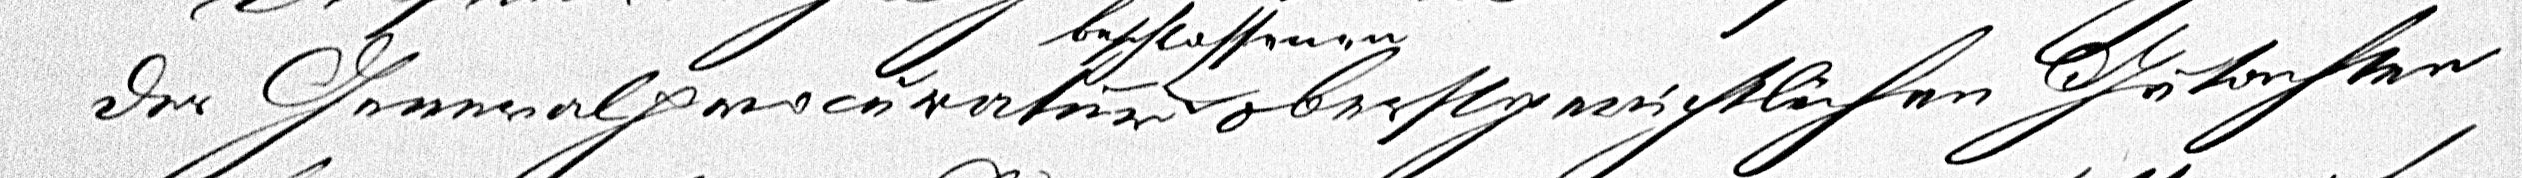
der Generalprocuratur oberstgerichtlichen Gutachten
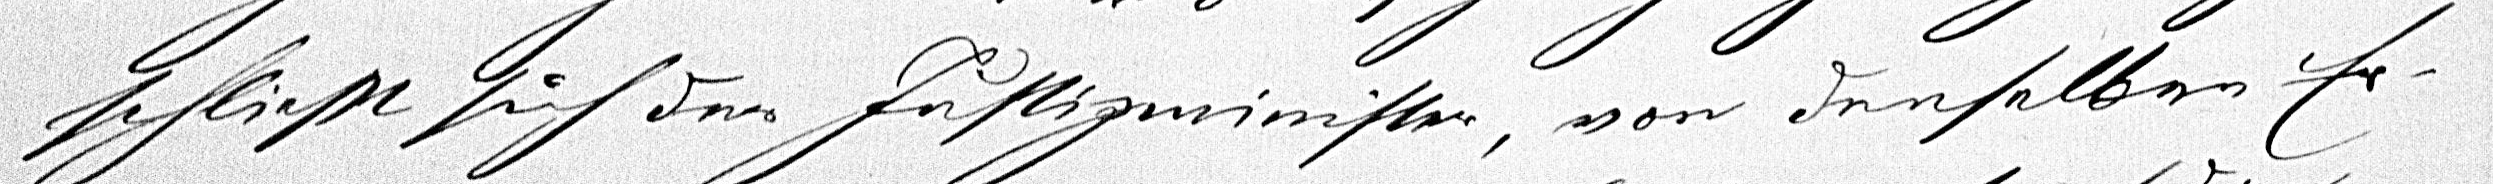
schließt sich des Justizminister, von denselben Er¬
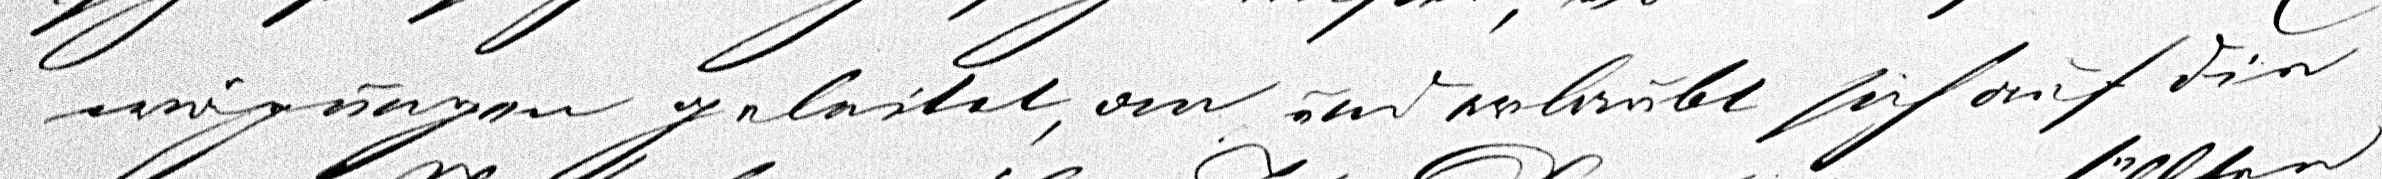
wägungen geleitet, an und erlaubt sich auf die
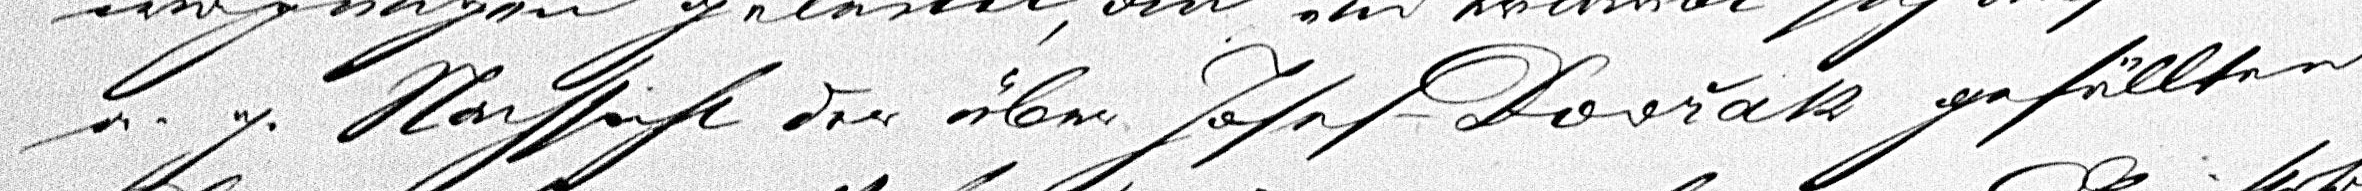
a. g. Nachsicht der über Josef Dvořák gefüllten
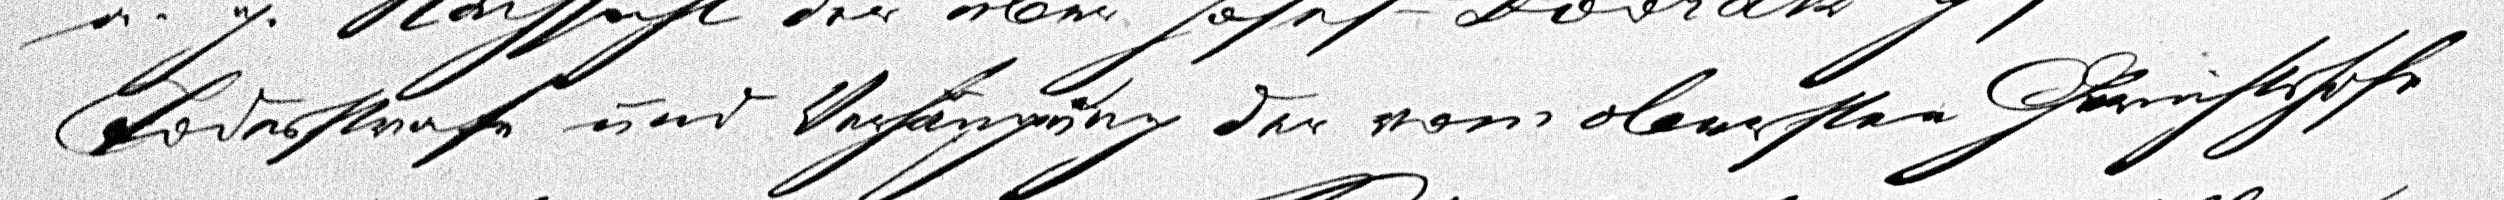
Todesstrafe und Verhängung der vom obersten Gerichtshofe
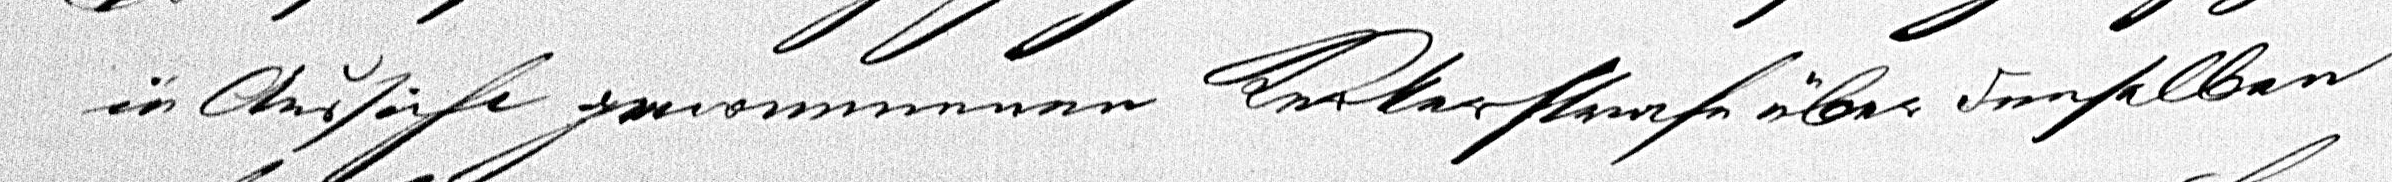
in Aussicht genommenen Kerkerstrafe über denselben
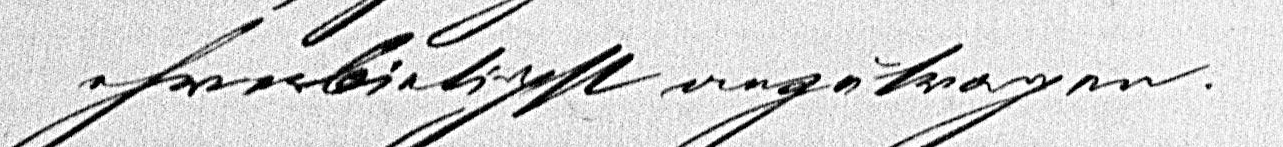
ehrerbietigst anzutragen.
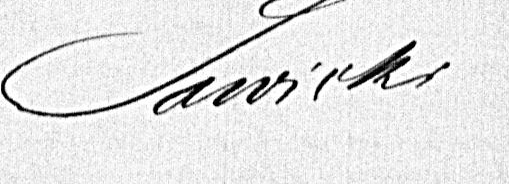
Sawicki
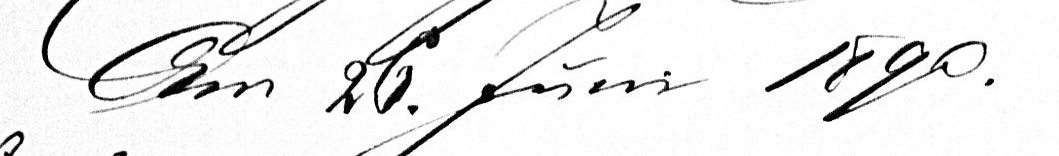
Am 26. Juni 1890.
